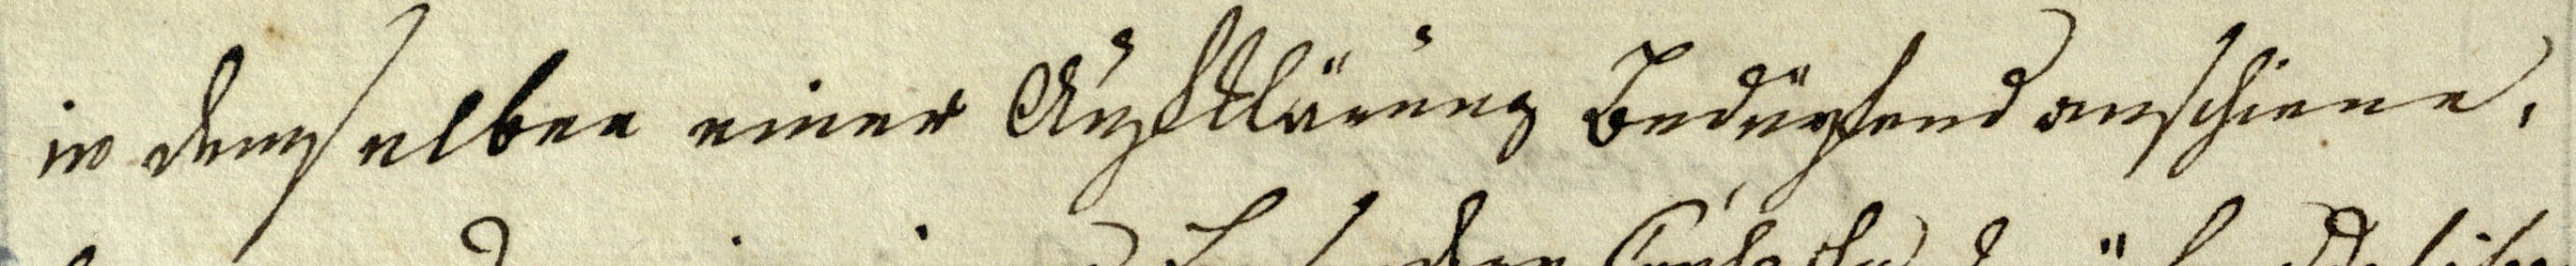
in demselben einer Aufklärung bedeÿtend anschiene,
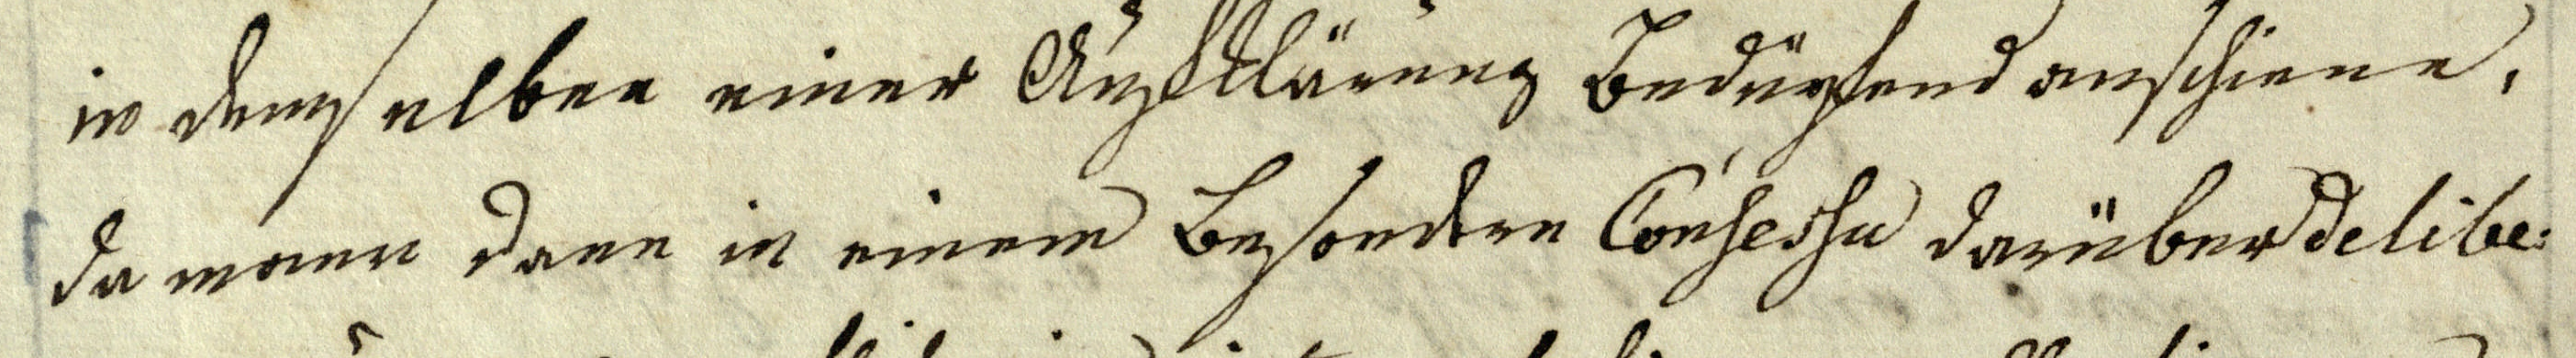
da mann dann in einem besondern Cosessu darüber delibe¬
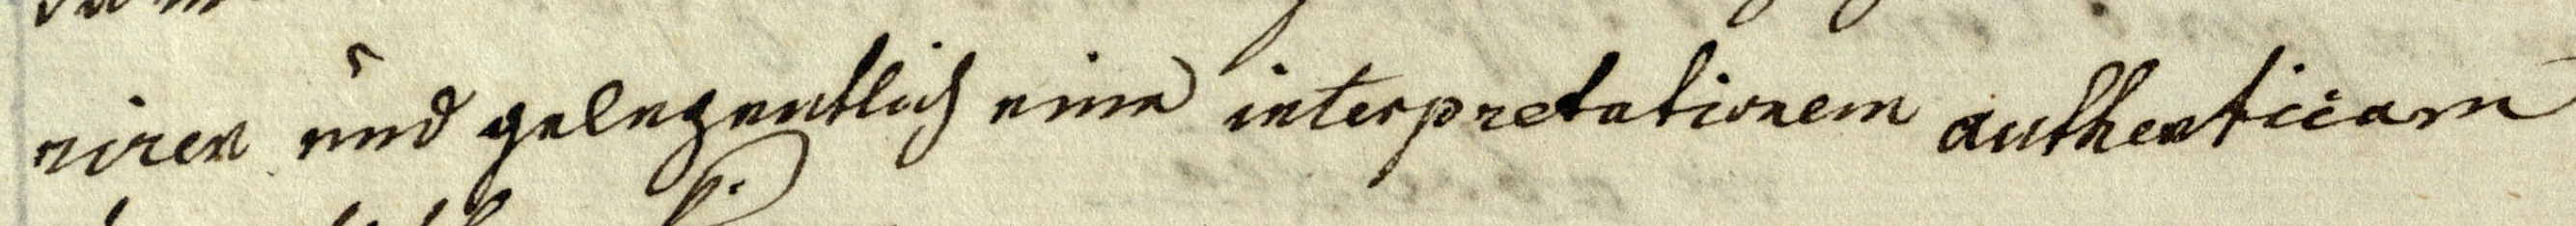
riren und gelegentlich eine interpretationem authenticam
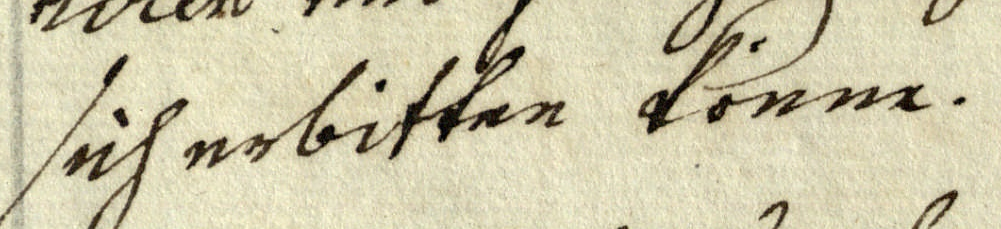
sich erbitten könne.
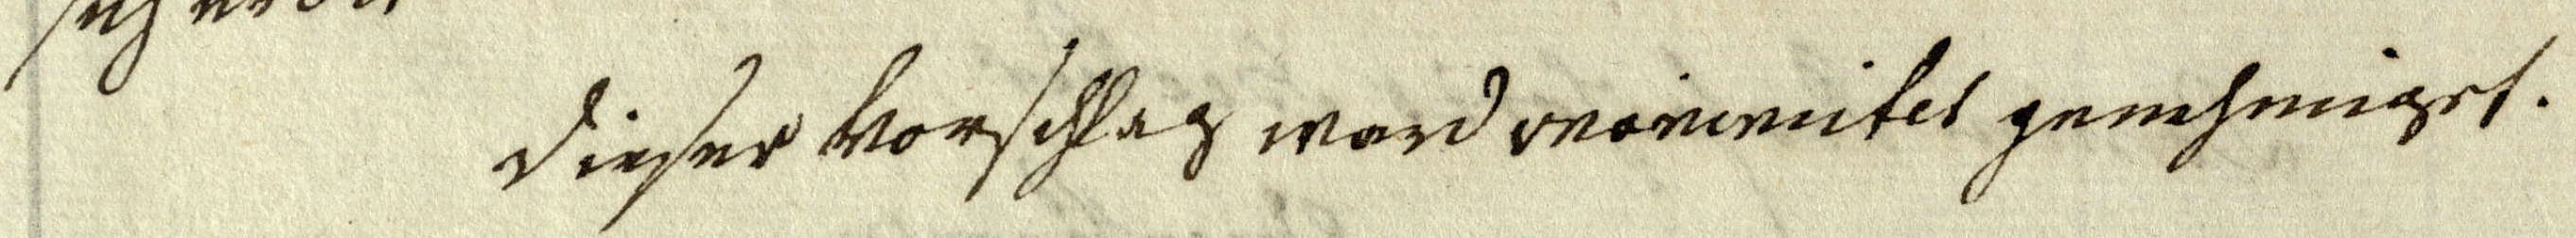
Dieser Vorschlag ward unanimiter genehmiget.
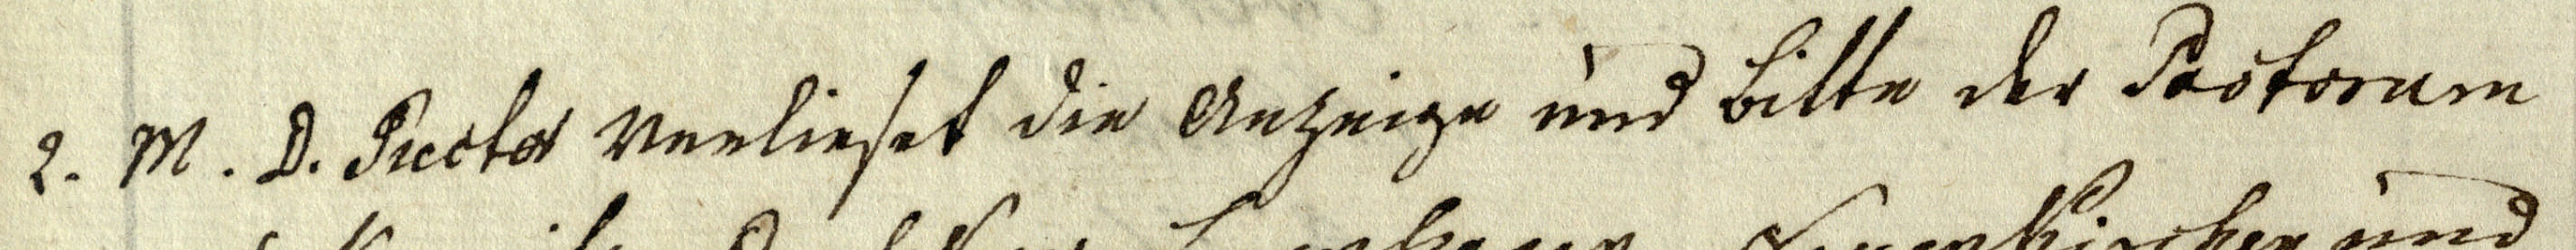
M. D. Rector verlieset die Anzeige und Bitte der Pastorum
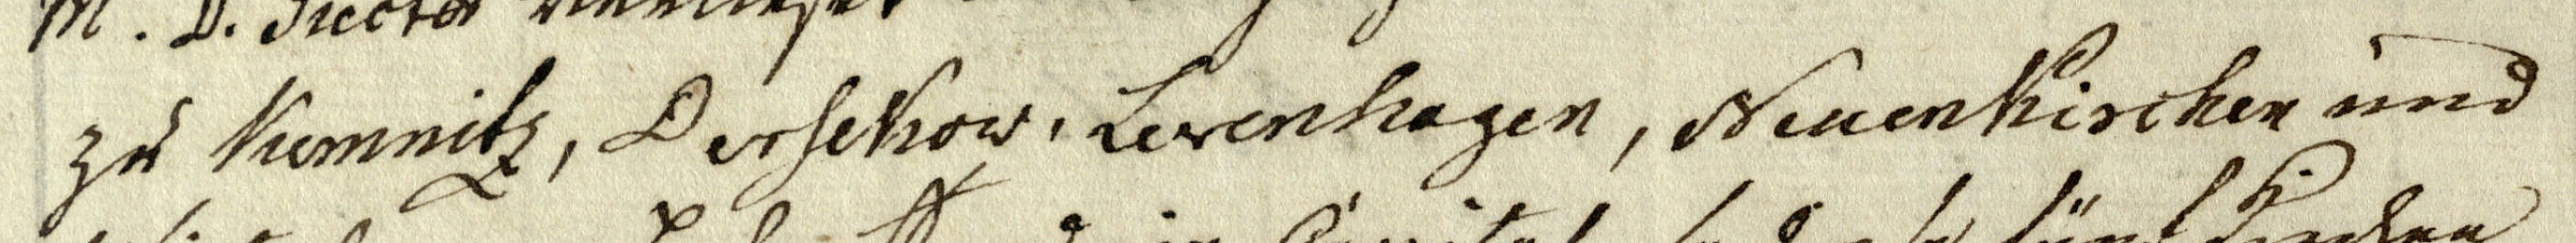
zu Kemnitz, Dersekow, Levenhagen, Neuenkirchen und
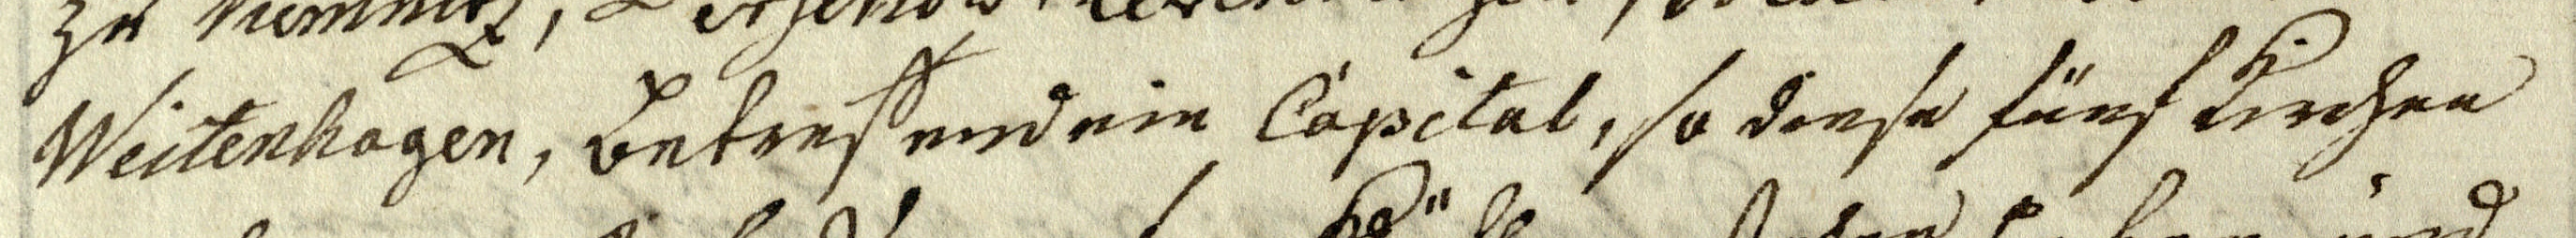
Weitenhagen, betreffend ein Capital, so diese fünf Kirchen
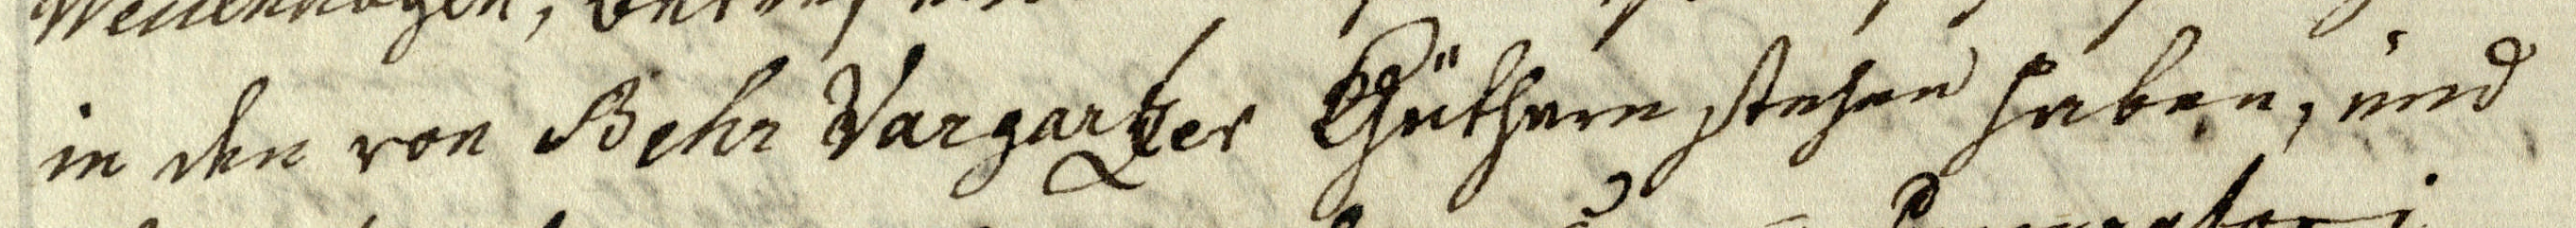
in den von Behr Vargatzer Güthern stehen haben, und
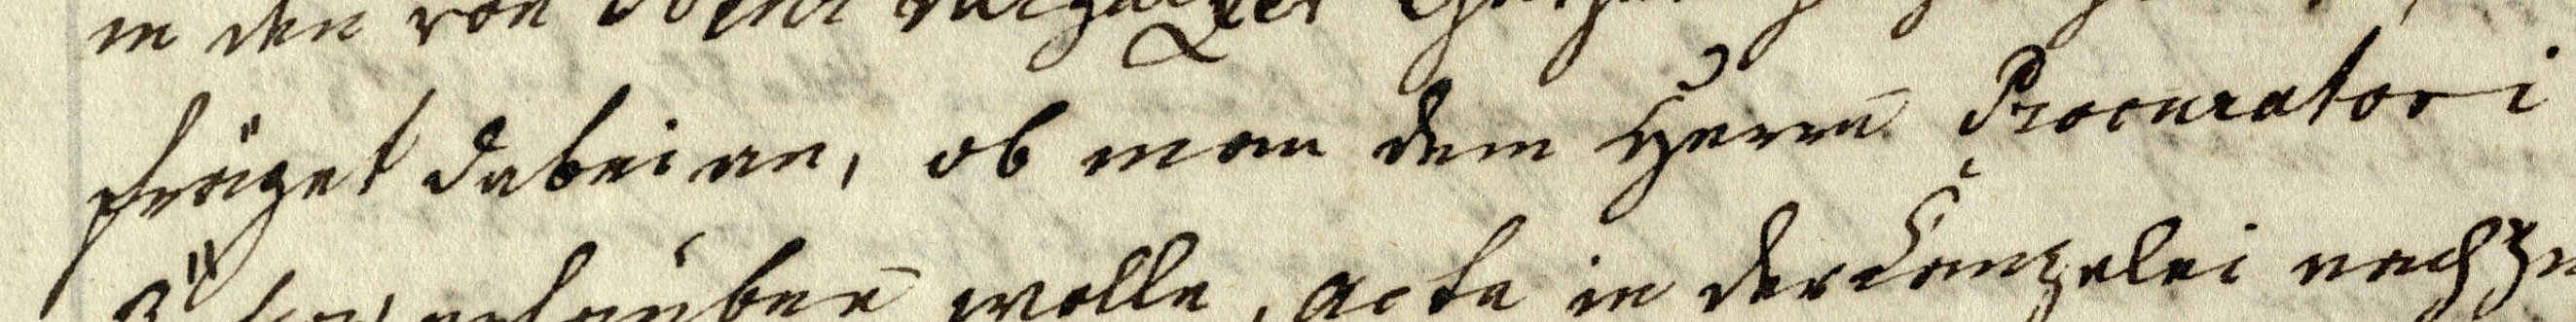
fräget dabei an, ob man dem Herrn Procuratori
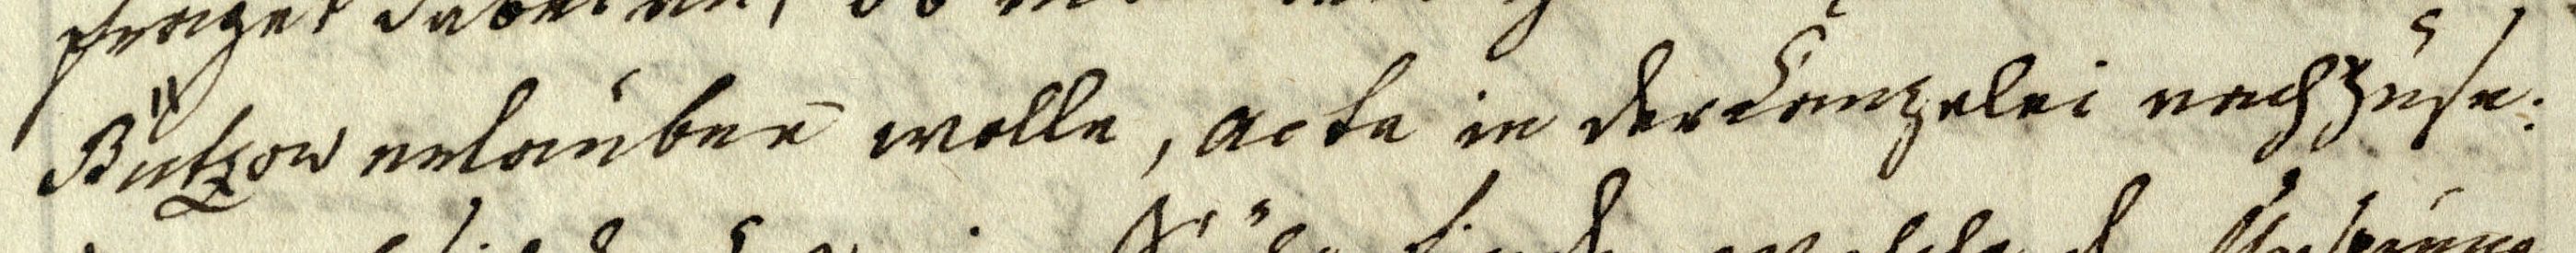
Bützow erlauben wolle, Acta in der Canzelei nachzuse¬
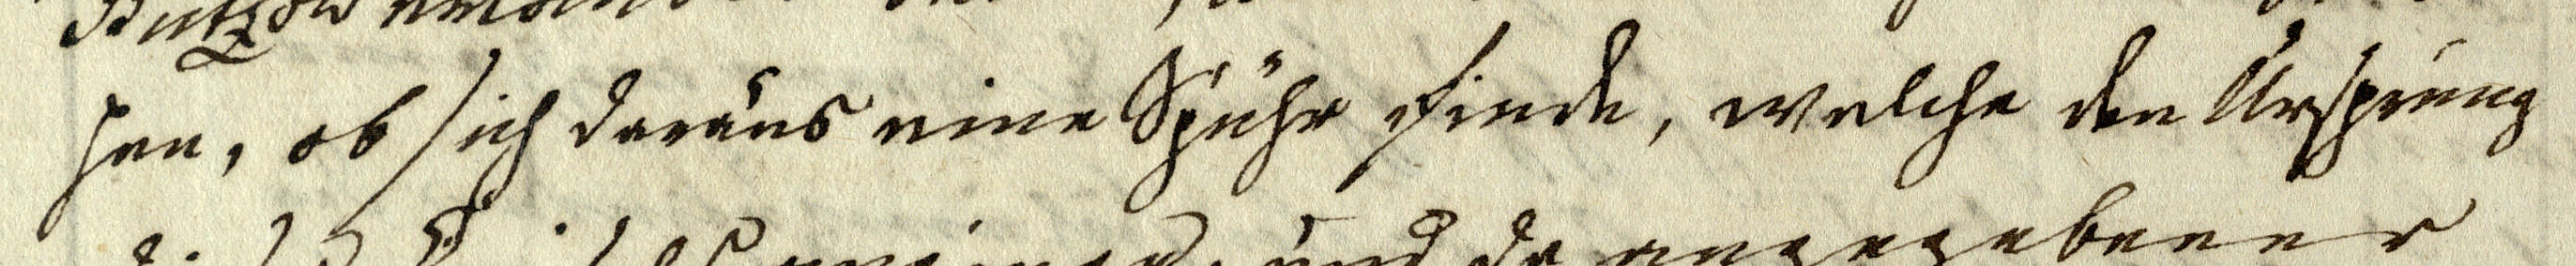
hen, ob sich daraus eine Spuhr finde, welche den Ursprung
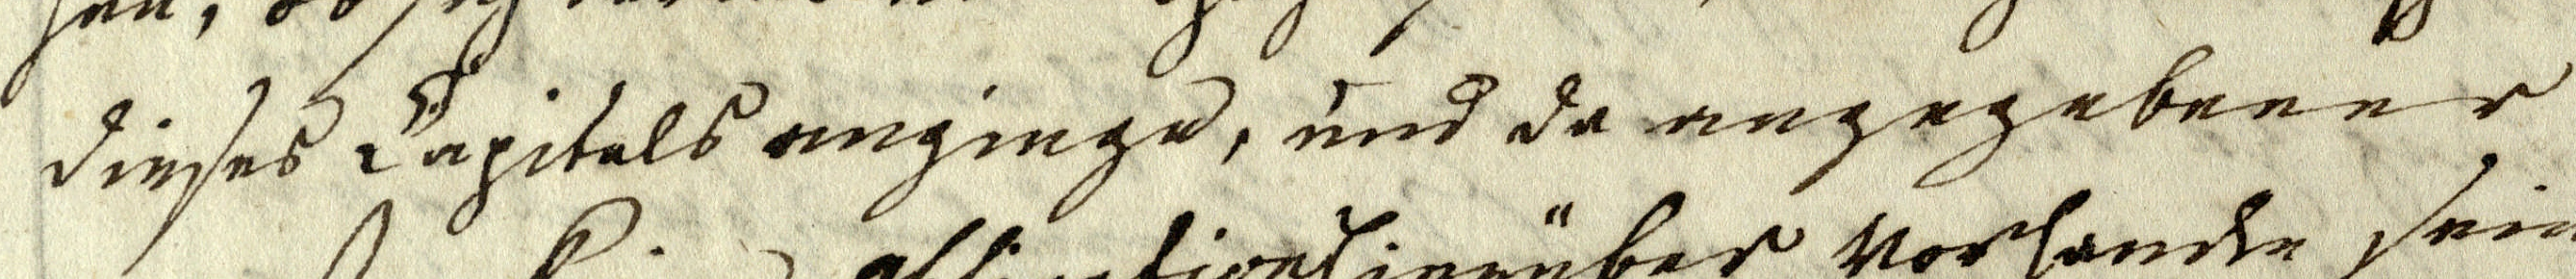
dieses Capitals anginge, und da angegebener
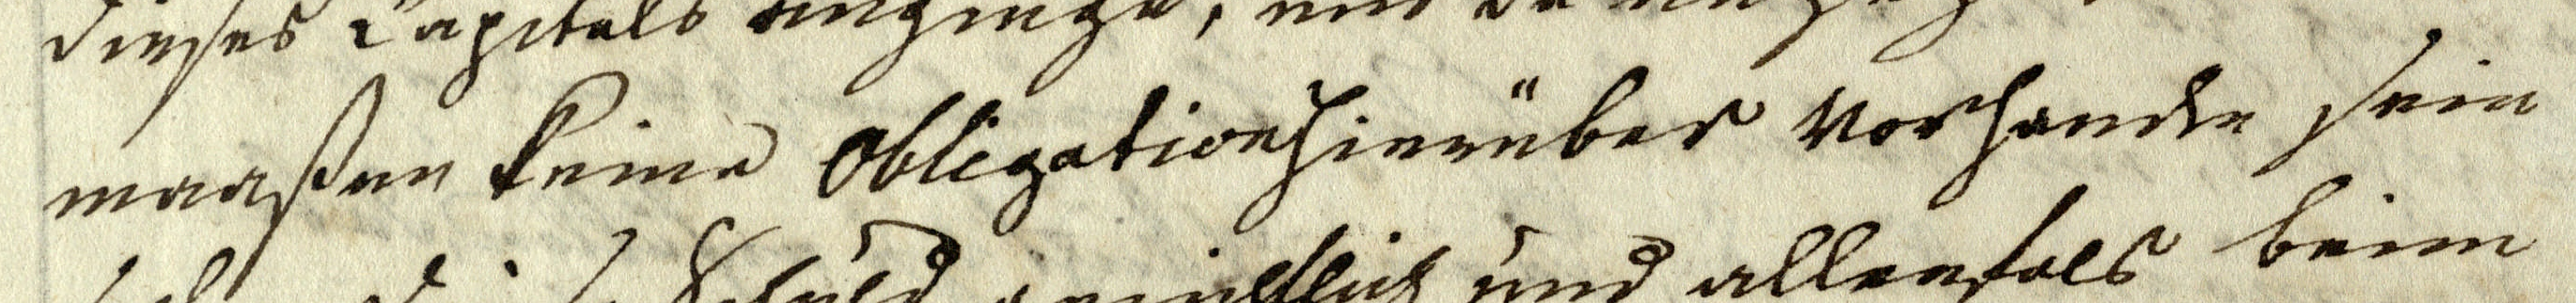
maaßen keine Obligation hierüber vorhanden sein
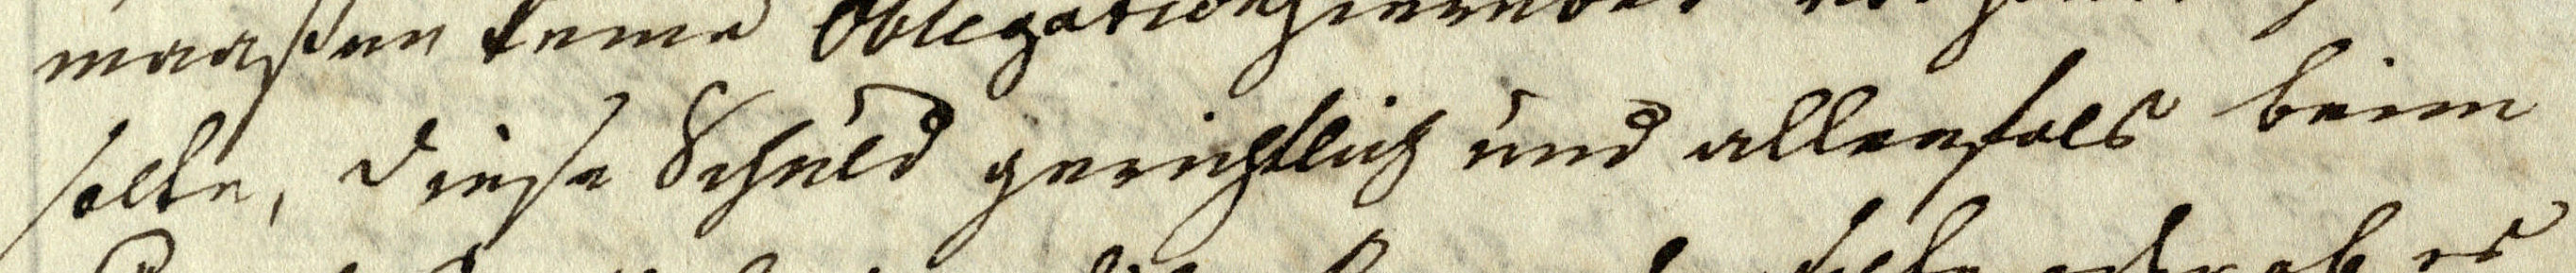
solte, diese Schuld gerichtlich und allenfals beim
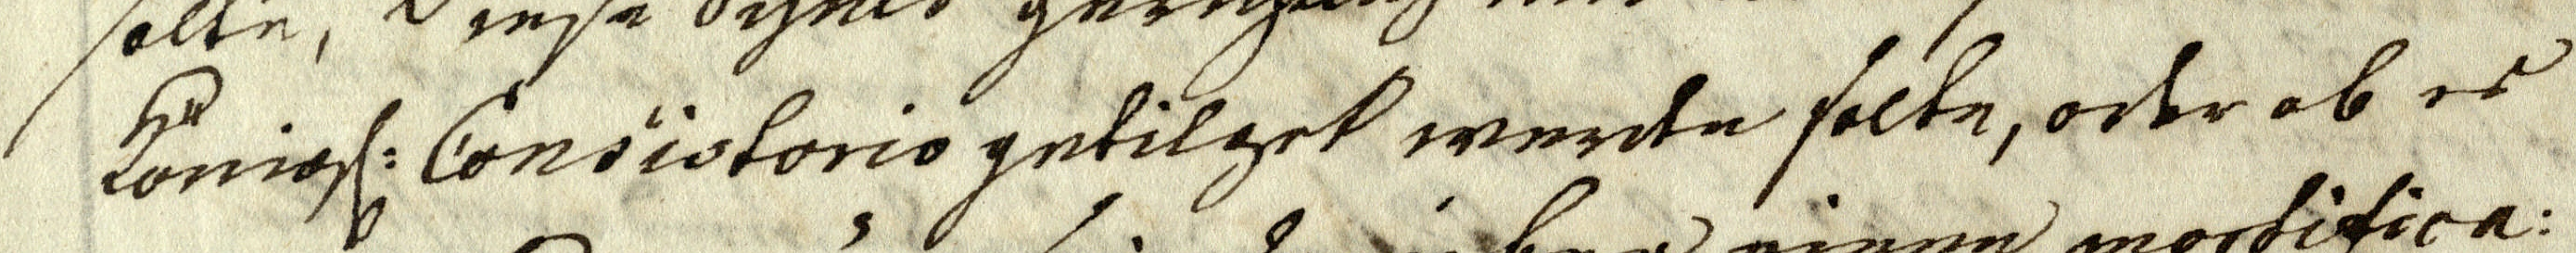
Königl. Consistorio getilget werden solte, oder ob es
